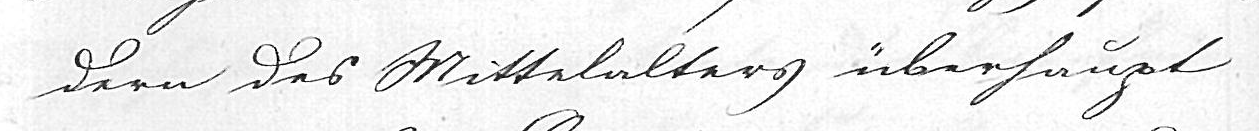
dern des Mittelalters überhaupt
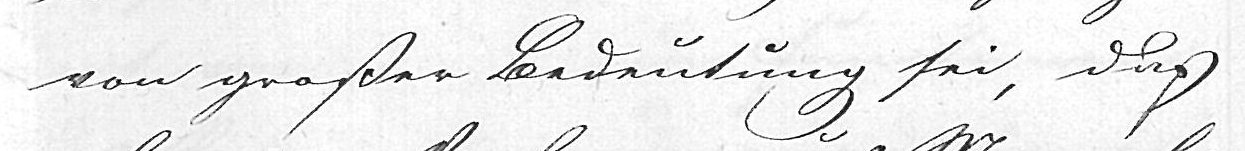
von großer Bedeutung sei, daß
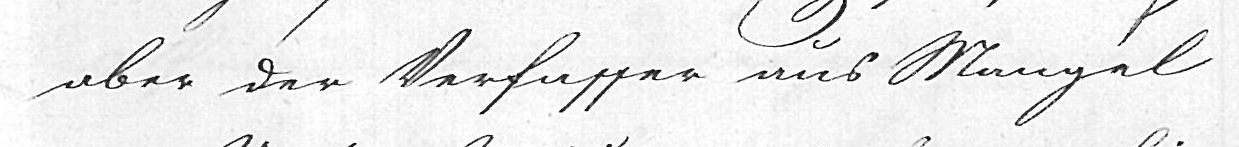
aber der Verfasser aus Mangel
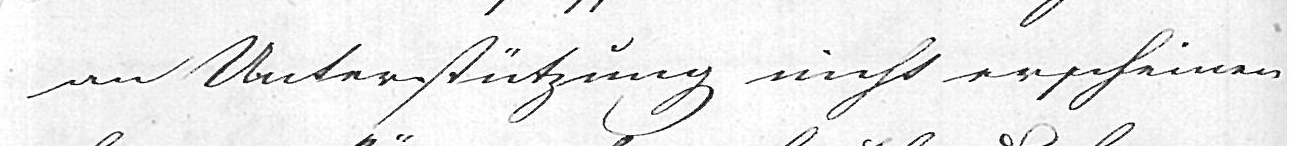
an Unterstützung nicht erscheinen
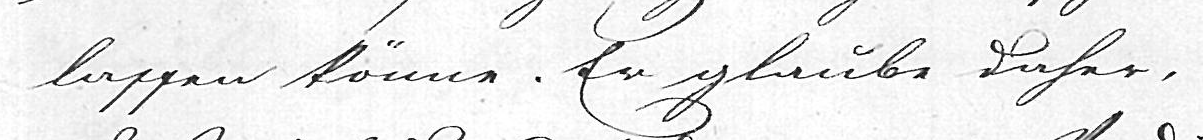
lassen könne. Er glaube daher,
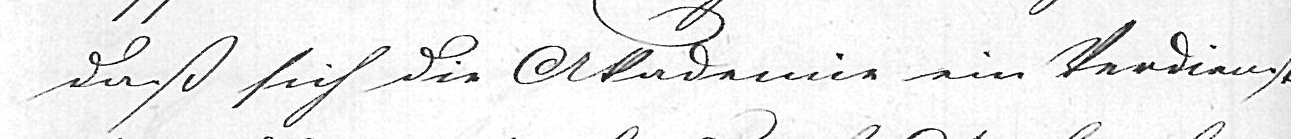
daß sich die Akademie ein Verdienst
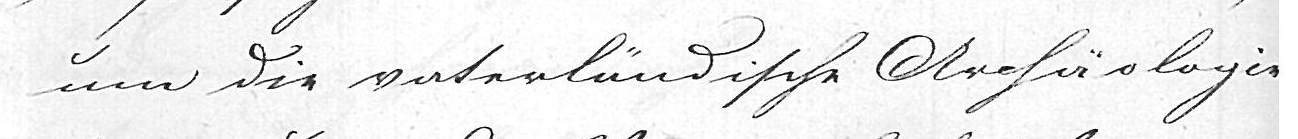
um die vaterländische Archäologie
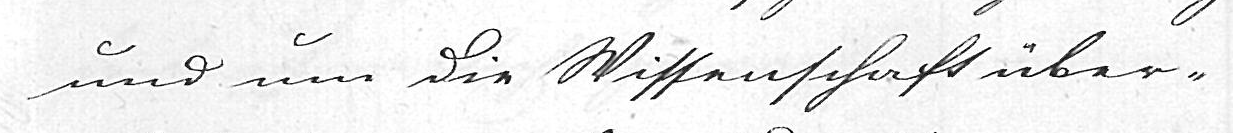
und um die Wissenschaft über-
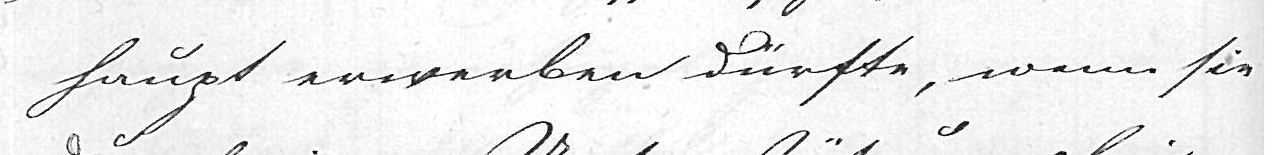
haupt erwerben dürfte, wenn sie
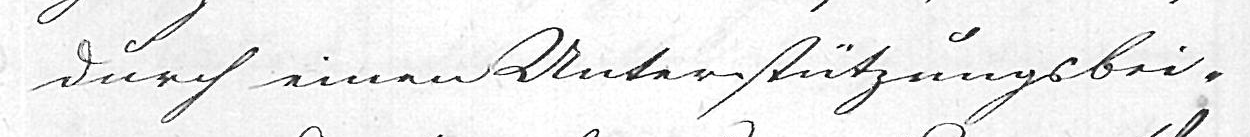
durch einen Unterstützungsbei-
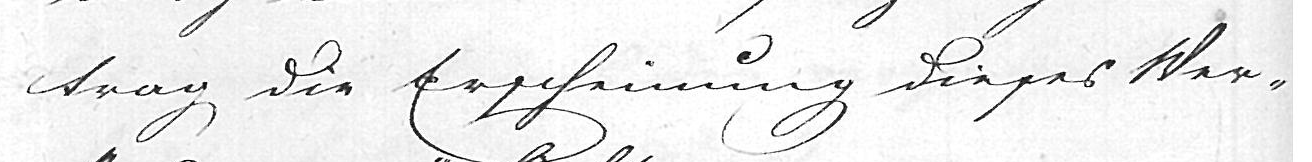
trag die Erscheinung dieses Wer-
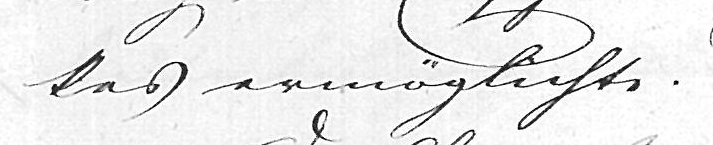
kes ermöglichte.
